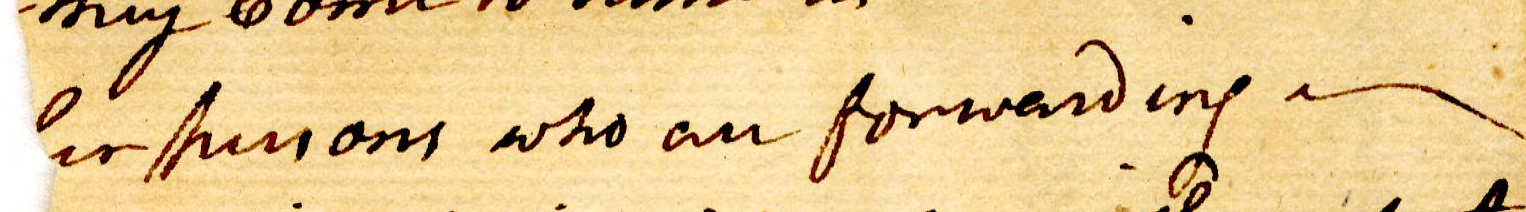[_]er persons who are forwarding-
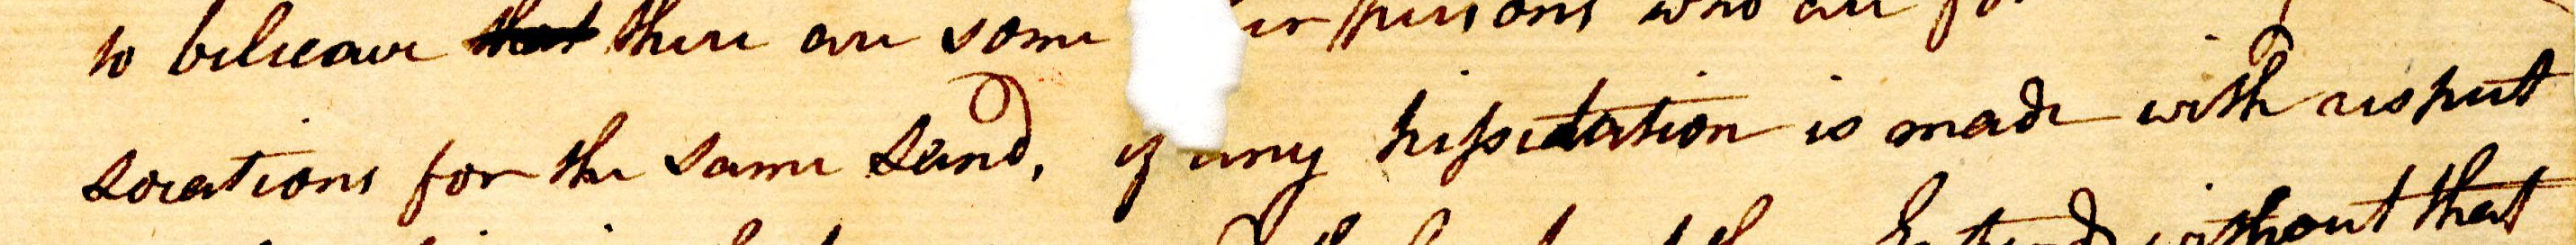Locations for the same Land, if any hesitation is made with respect
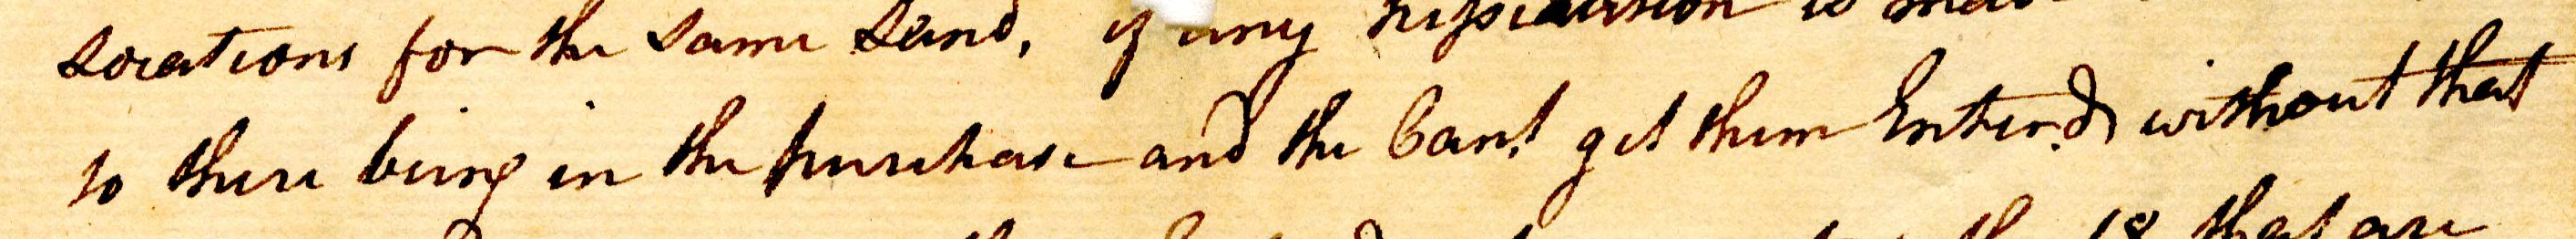to there being in the purchase and the Can^l git them Enter'd without that
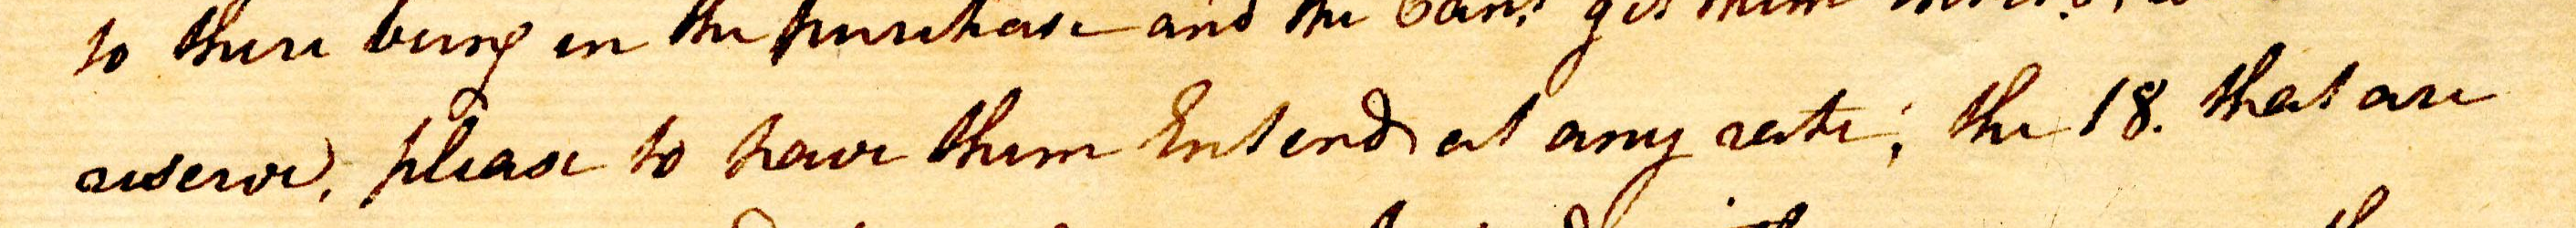anserve, please to have them enterd at any rate; the 18. that are
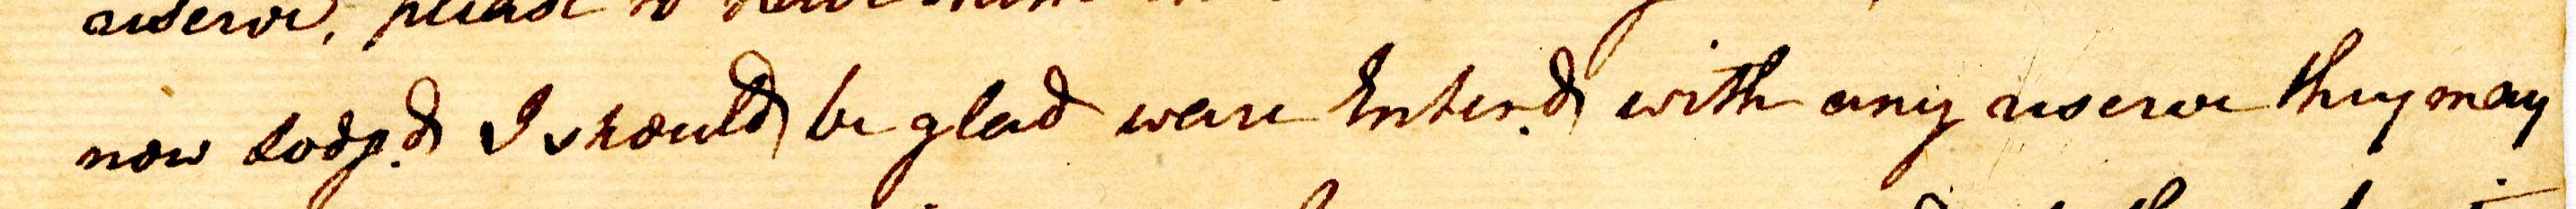now Lodg'd I should be glad were Enter'd with any reserve they may
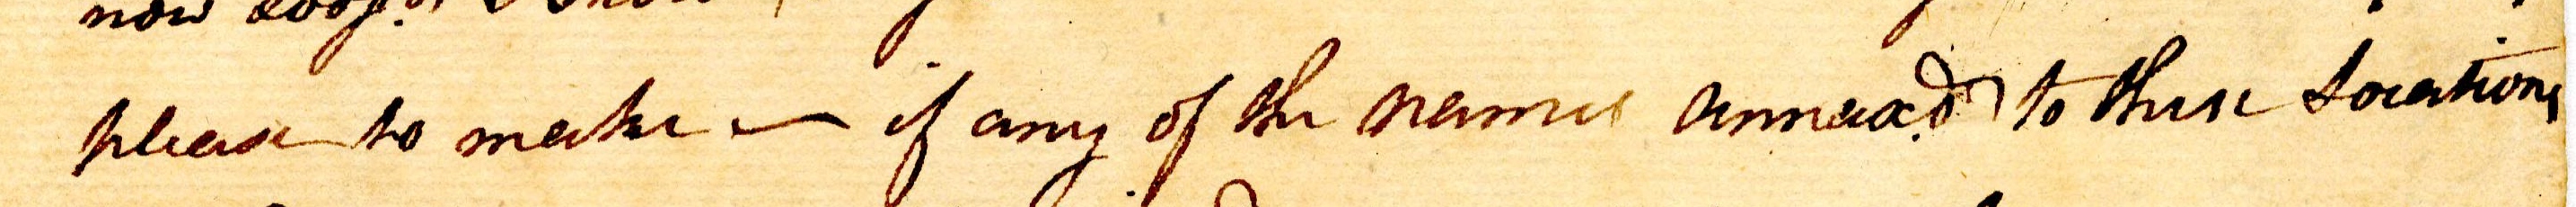please to make- if any of the names annex'd to these Locations
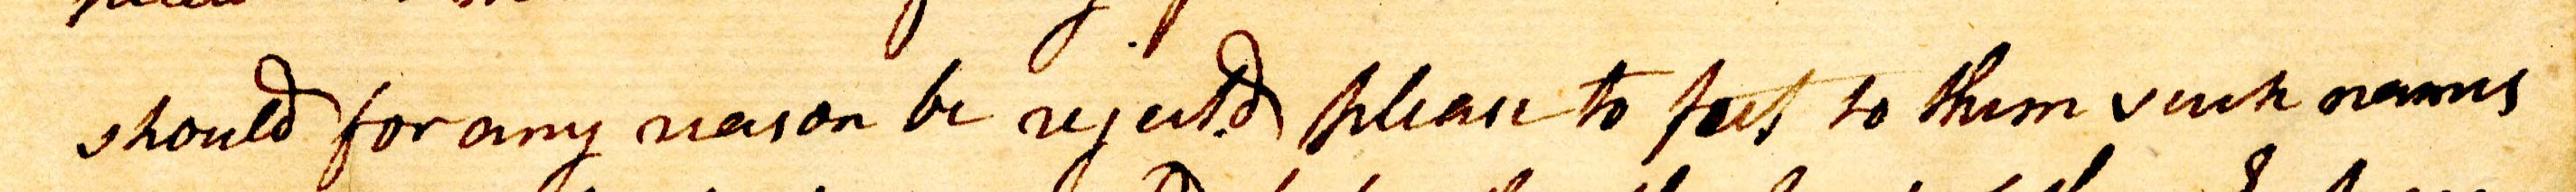should for any reason be reject'd please to put to them such names
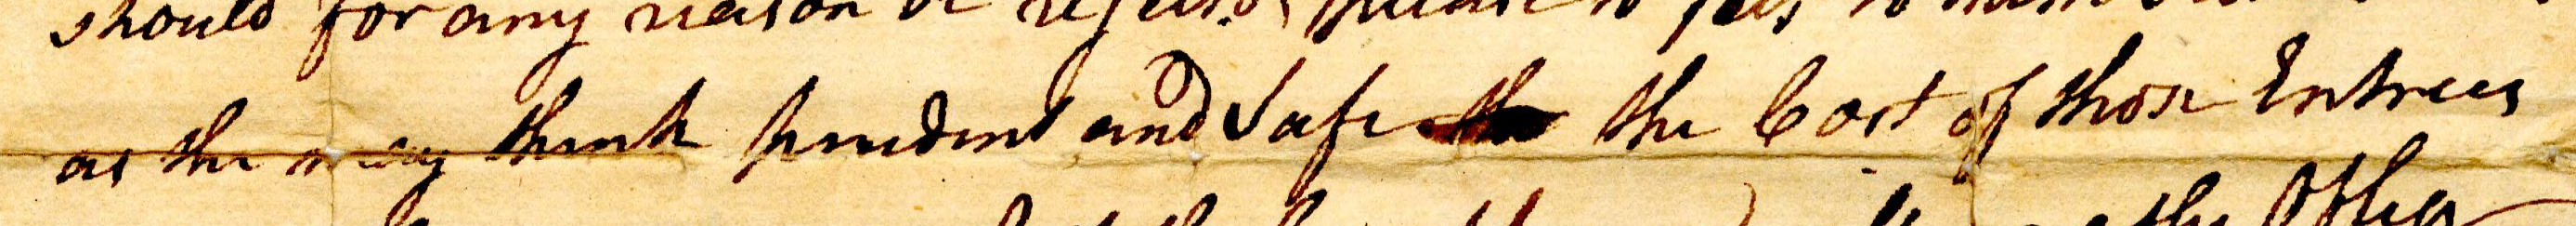as they may think prudent and safe [the] the Cost of those Entrees
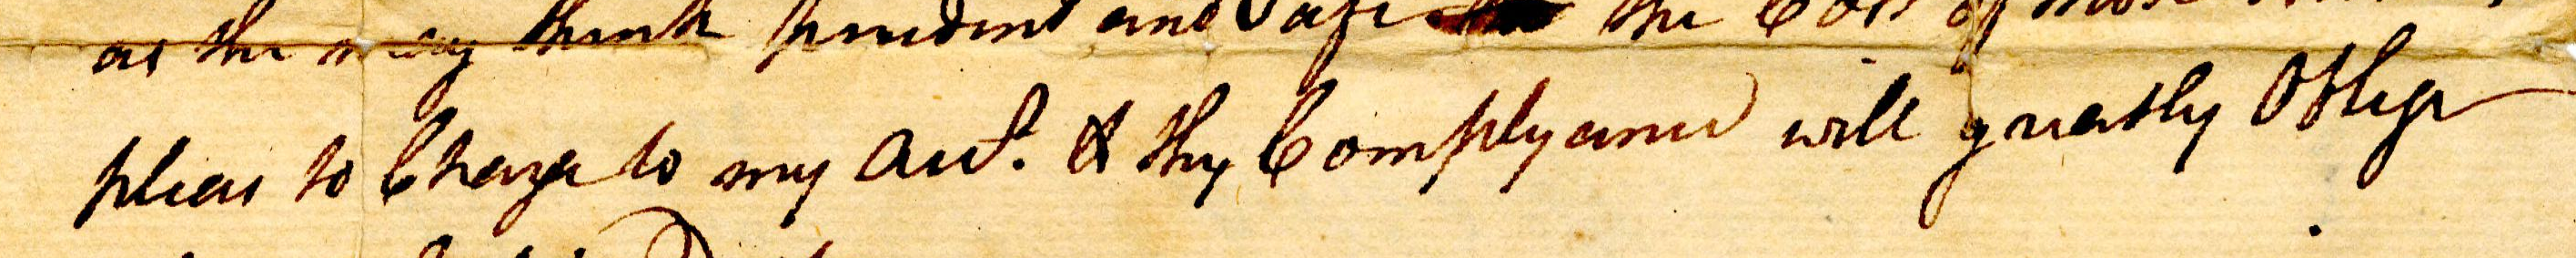please to Charge to my Acc^t. & thy Complyance will greatly Oblige
